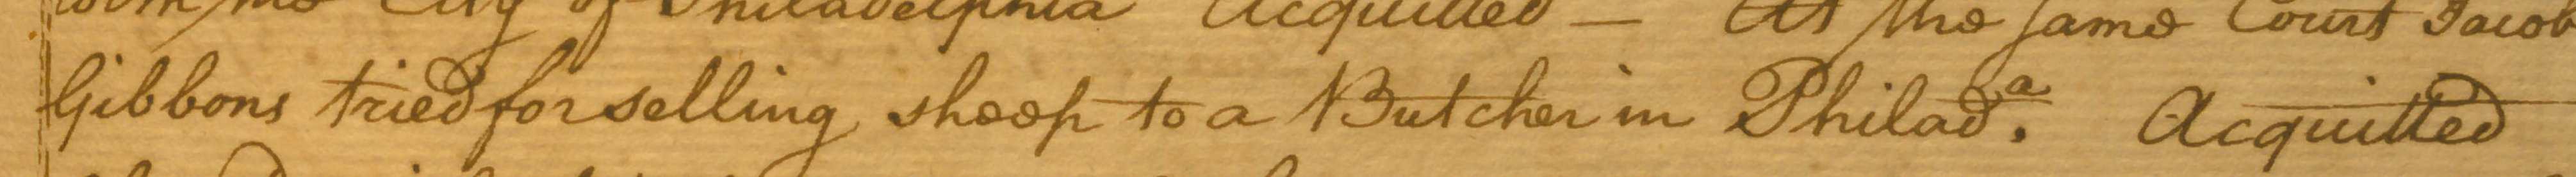Gibbons tried for selling sheep to a Butcher in Philad^a. Acquitted
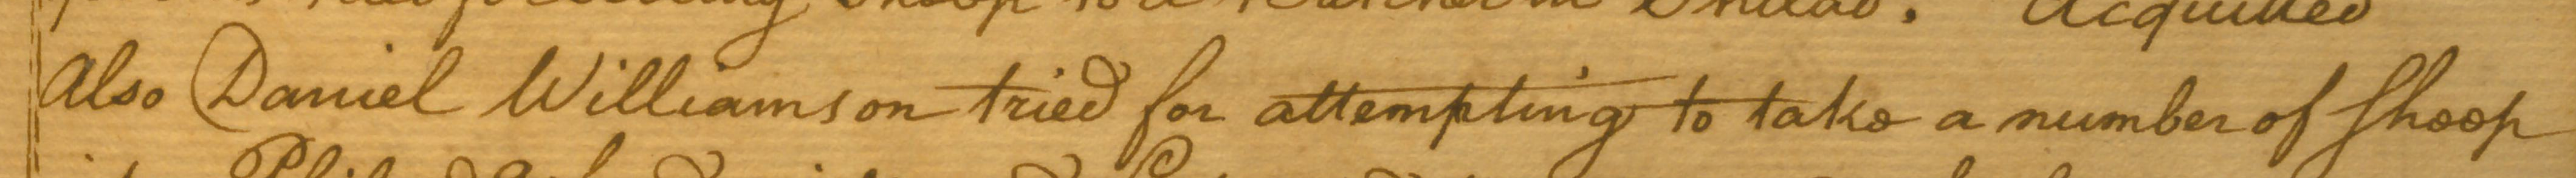Also Daniel Williamson tried for attempting to take a number of sheep
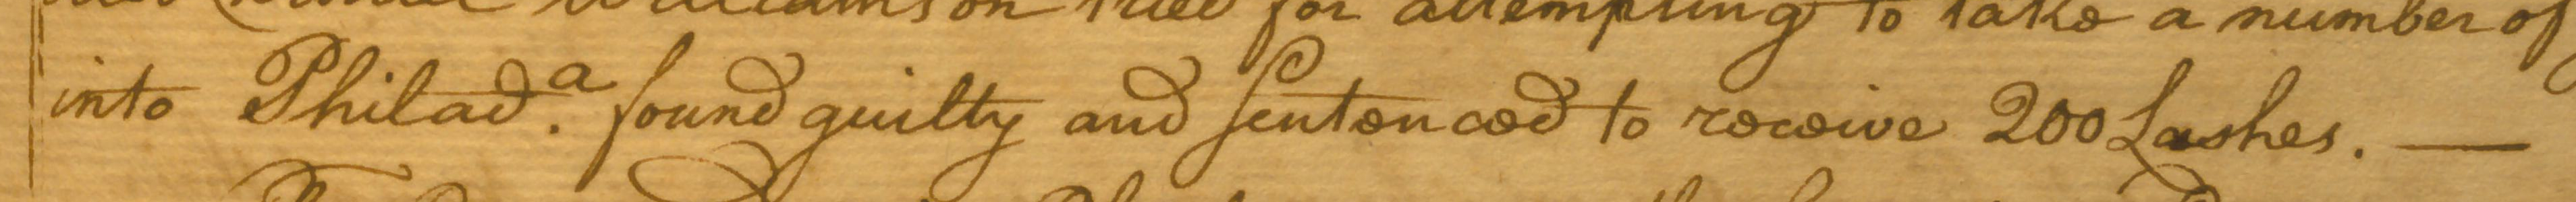into Philad^a. found guilty and sentenced to receive 200 Lashes.-
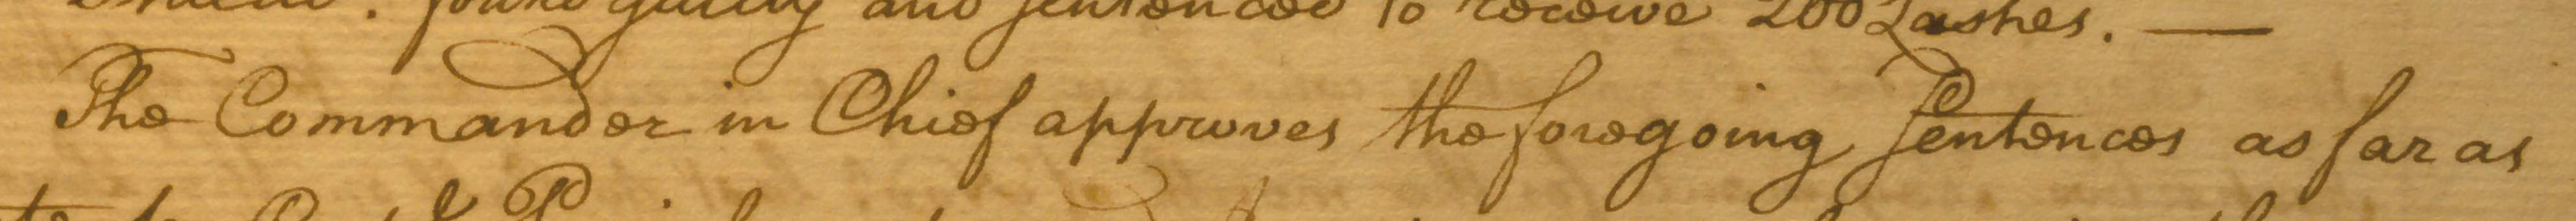The Commander in Chief approves the foregoing sentences as far as
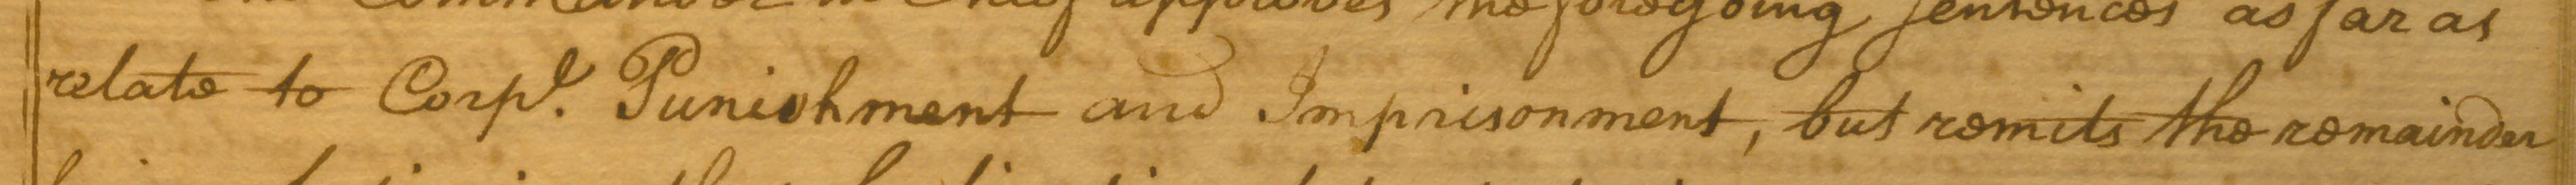relate to Corp^l. Punishment and Imprisonment, but remits the remainder
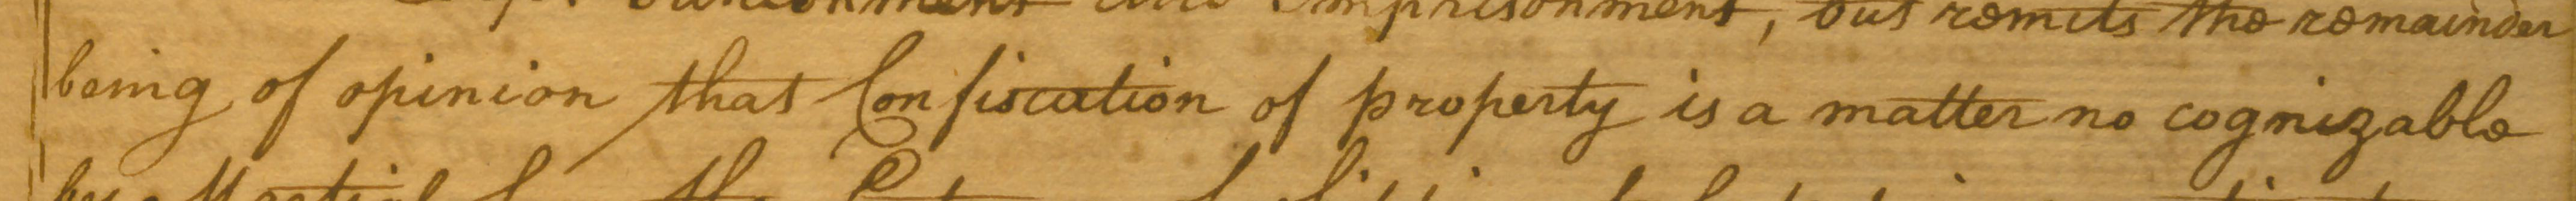being of opinion that Confiscation of property is a matter no cognizable
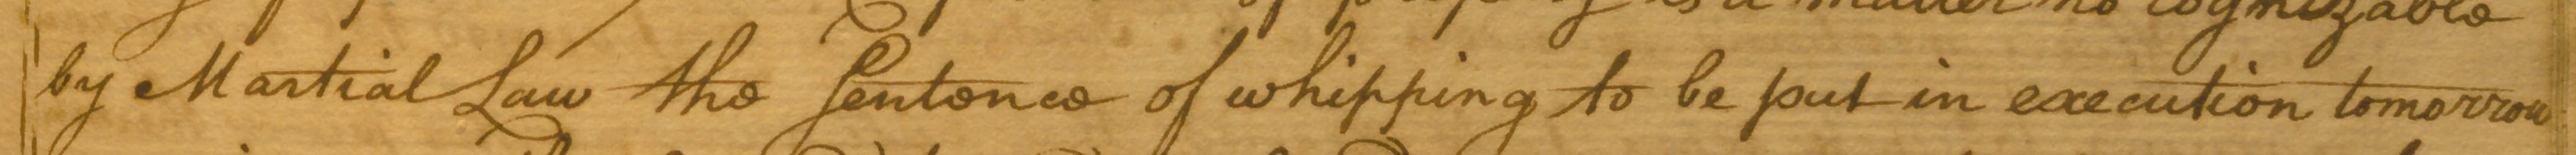by Martial Law the sentence of whipping to be put in execution tomorrow
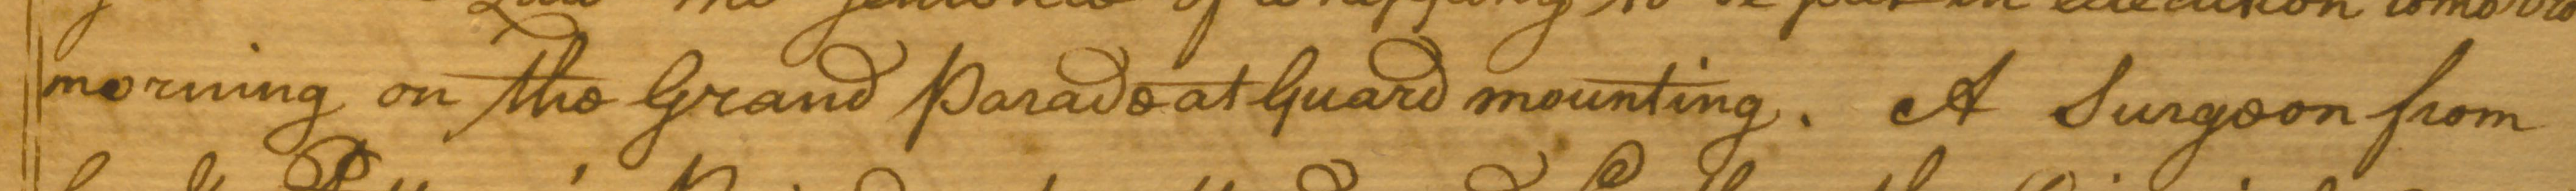morning on the Grand parade at Guard mounting. A Surgeon from
